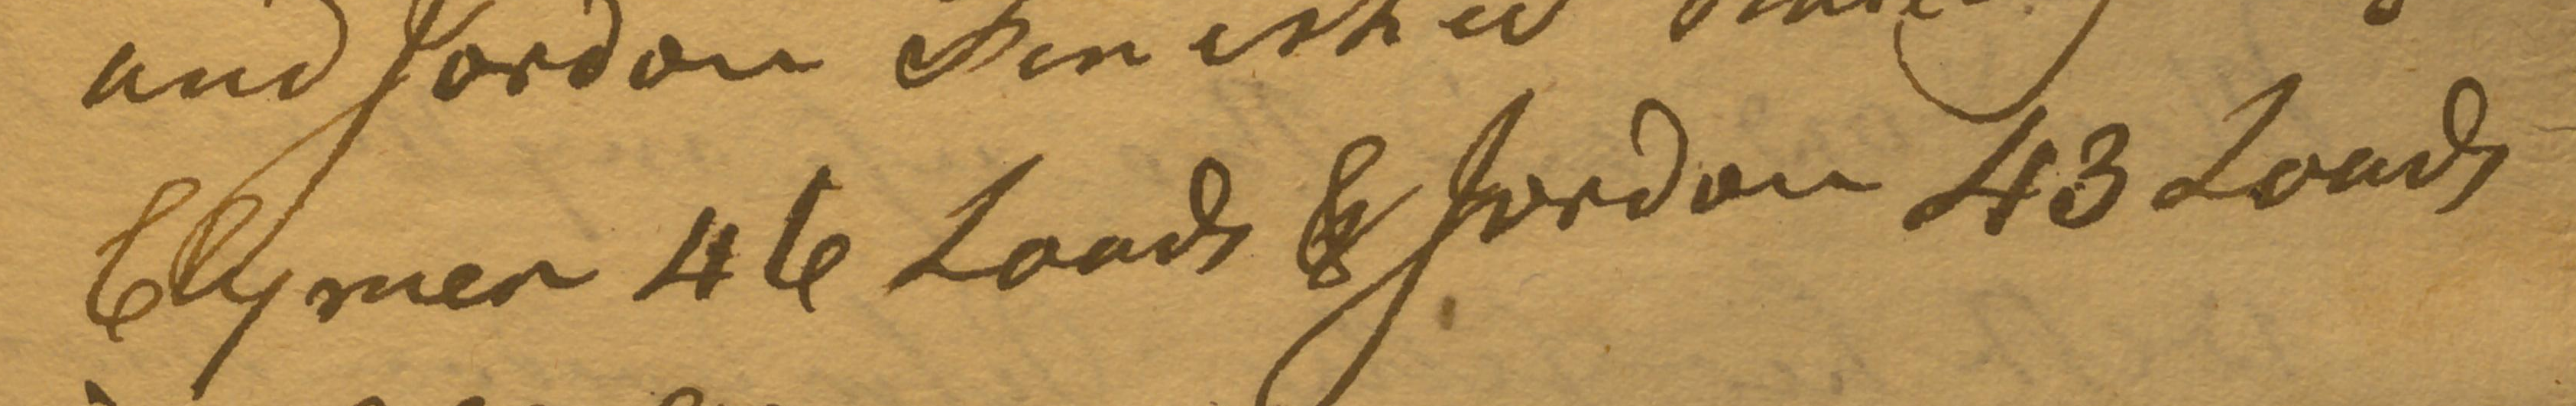Clymer 46 Loads & Jordan 43 Loads
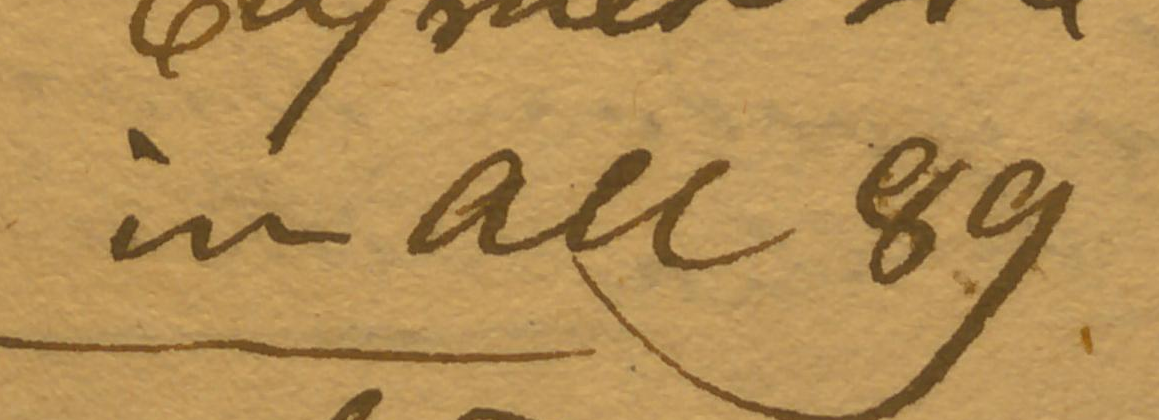in all 89
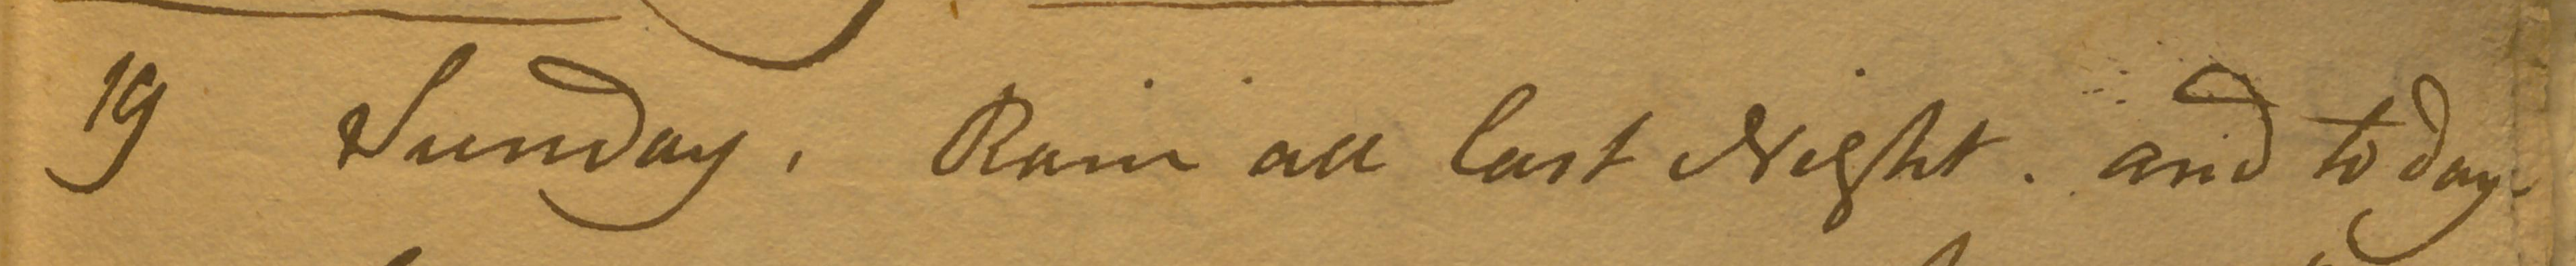19 Sunday. Rain all last Night. and to day
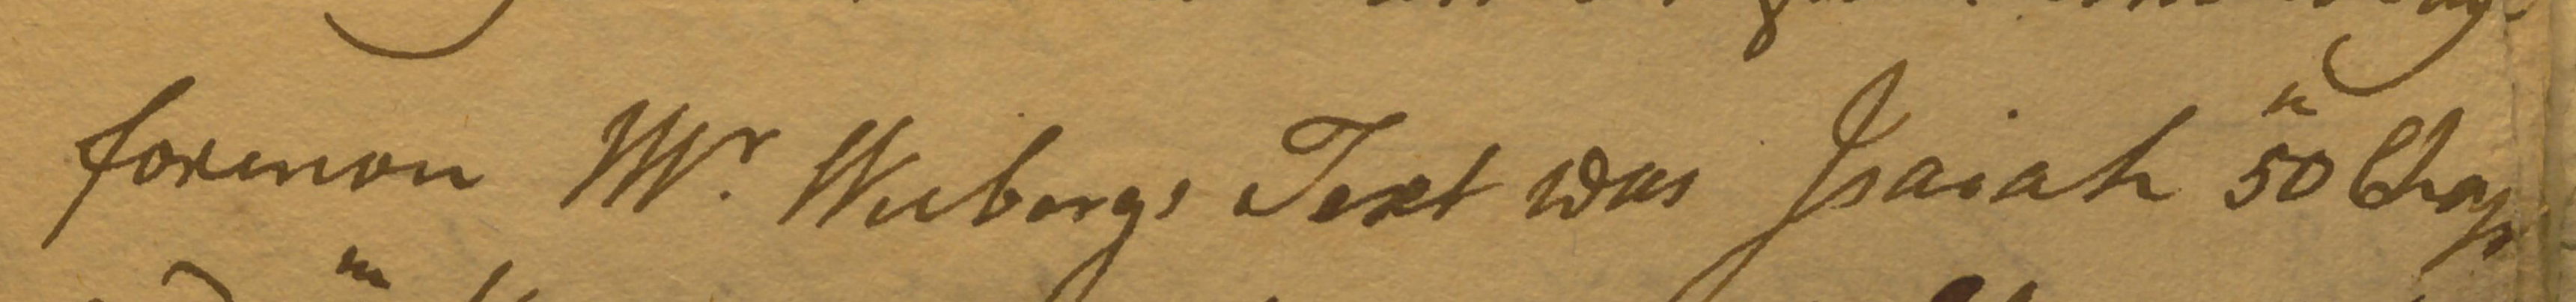forenon M^r. Weibergs Text was Isaiah 50^th Chap
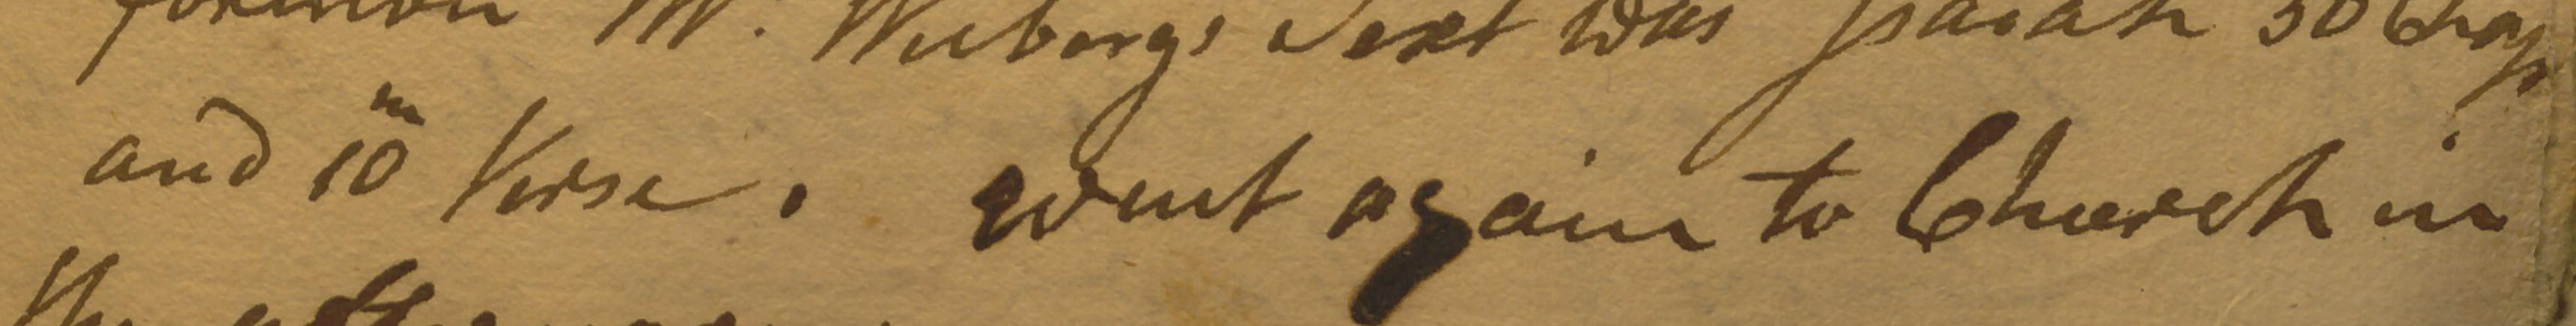and 10^th Verse. went again to Church in
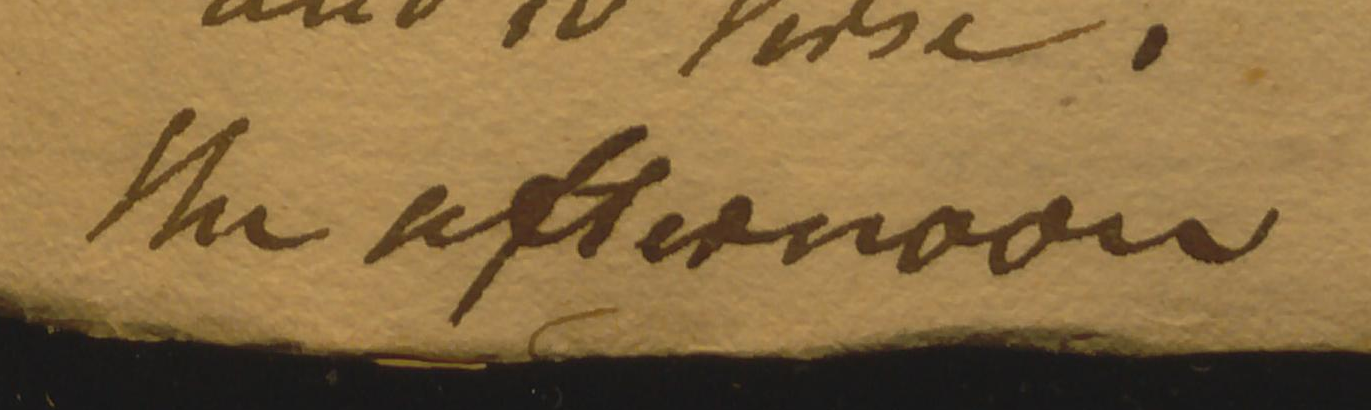the afternoon
